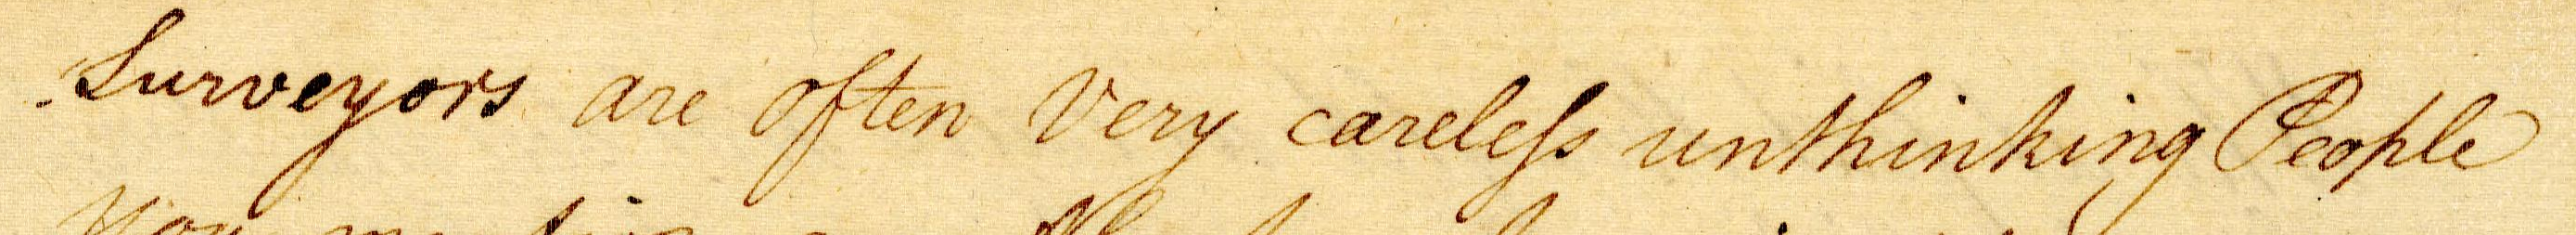Surveyors are often Very careless unthinking People
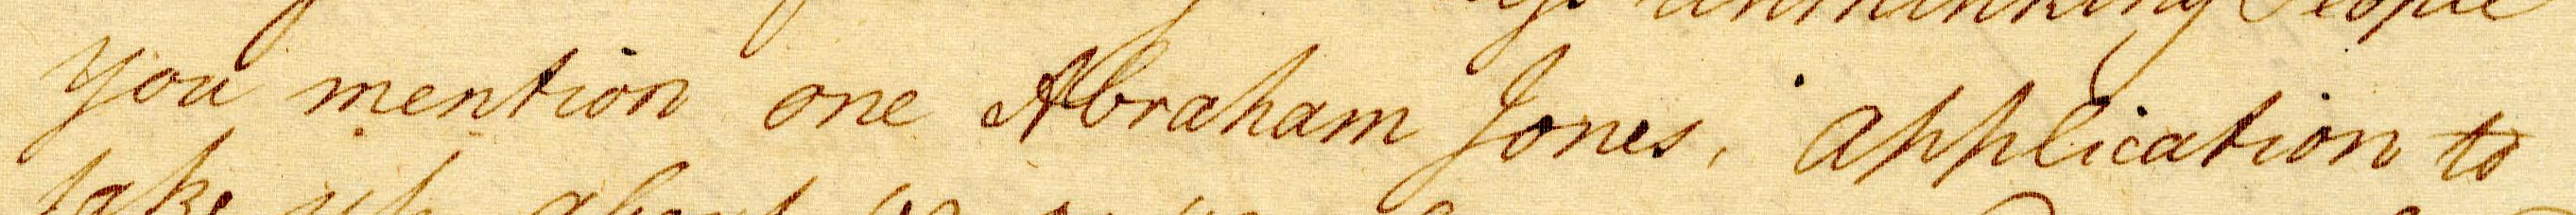You mention one Abraham Jones, application to
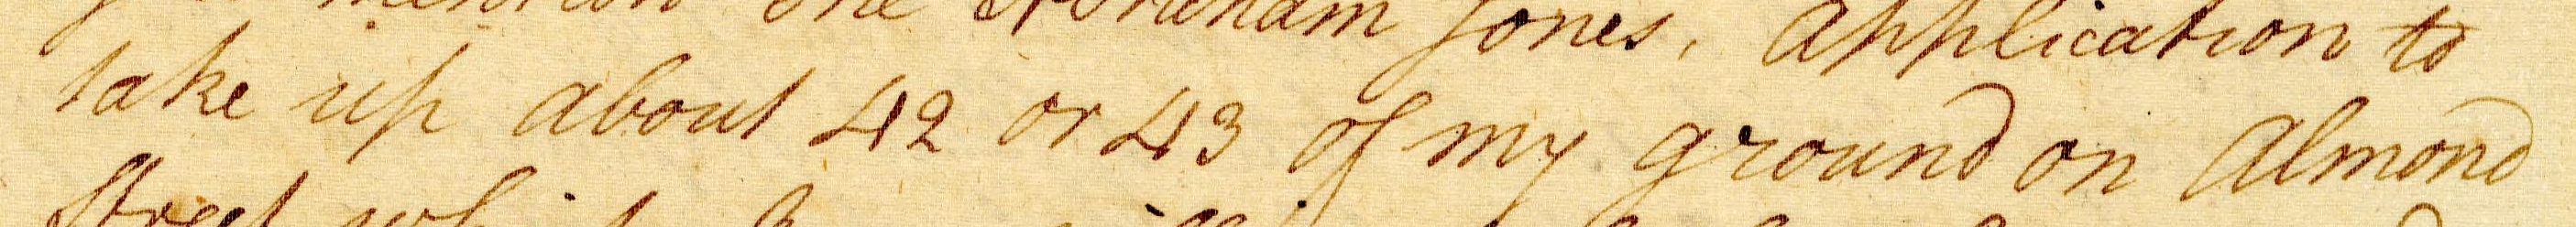take up about 42 or 43 of my ground on Almond
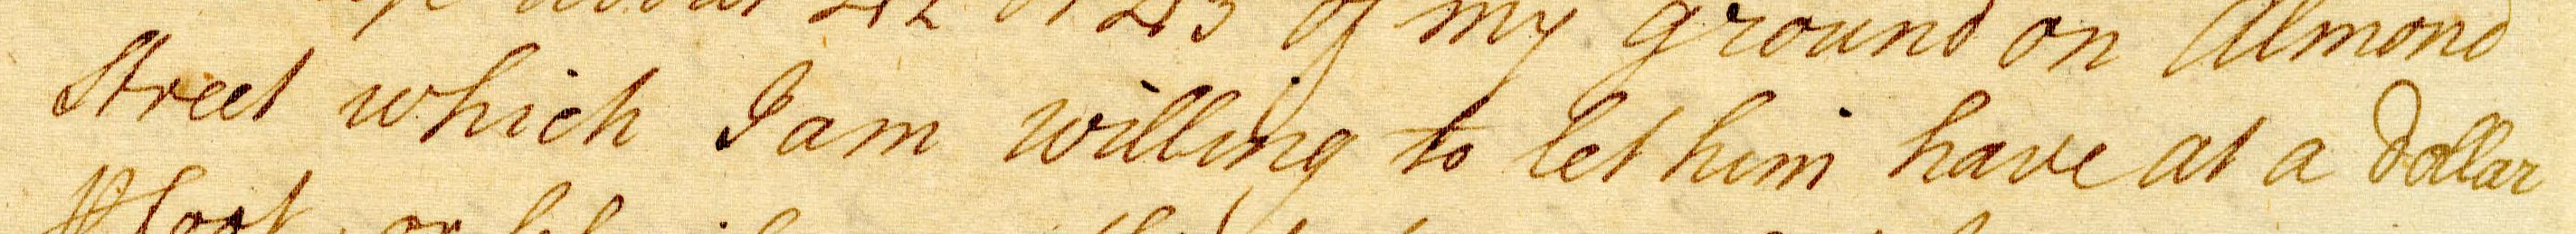Street which I am willing to let him have at a dollar
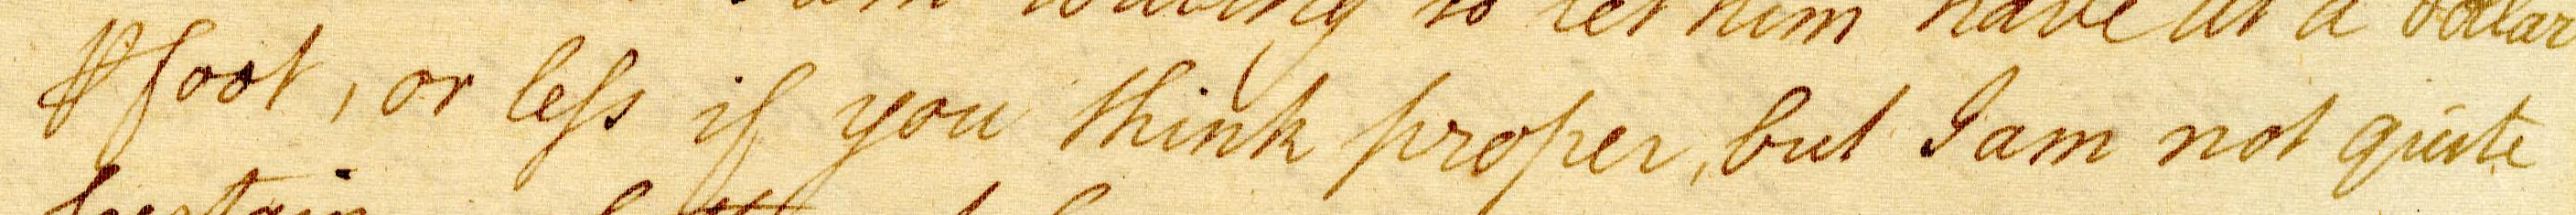per foot, or less if you think proper, but I am not quite
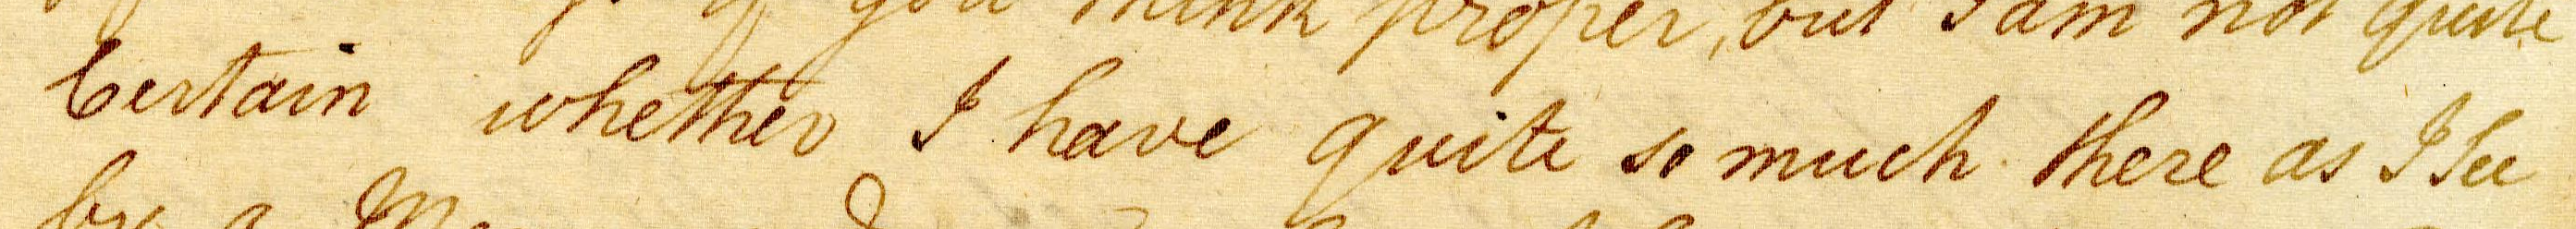Certain whether I have quite so much there as I see
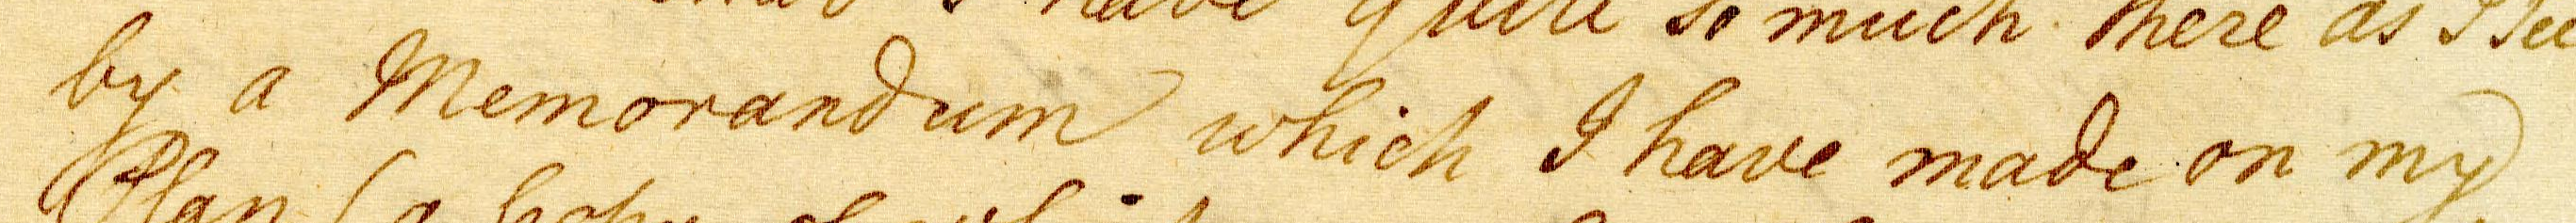by a Memorandum which I have made on my
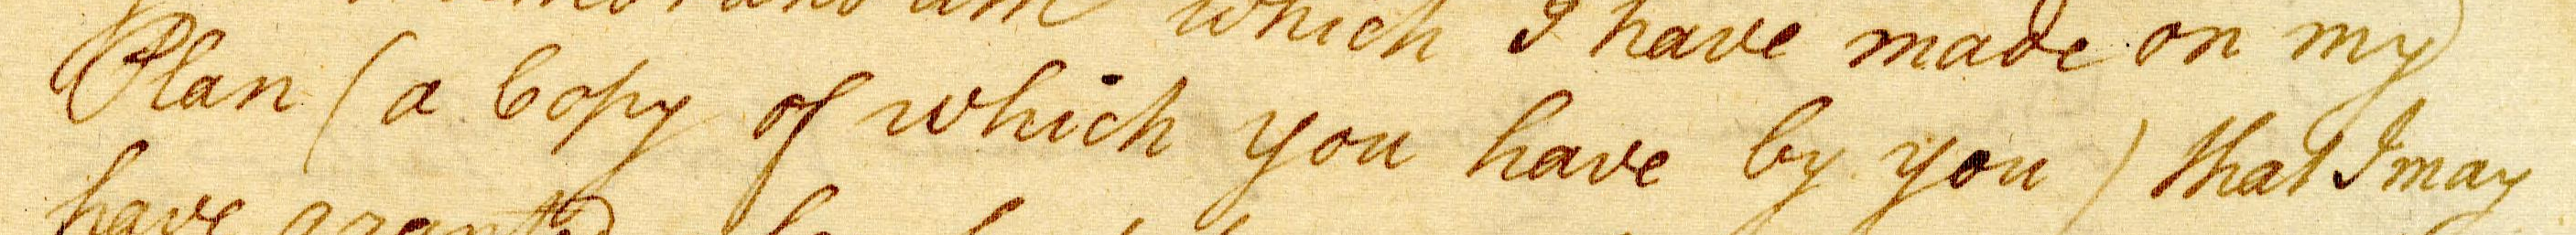Plan ( a Copy of which you have by you) that I may
